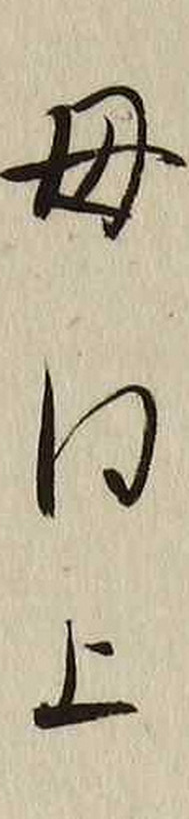母同上
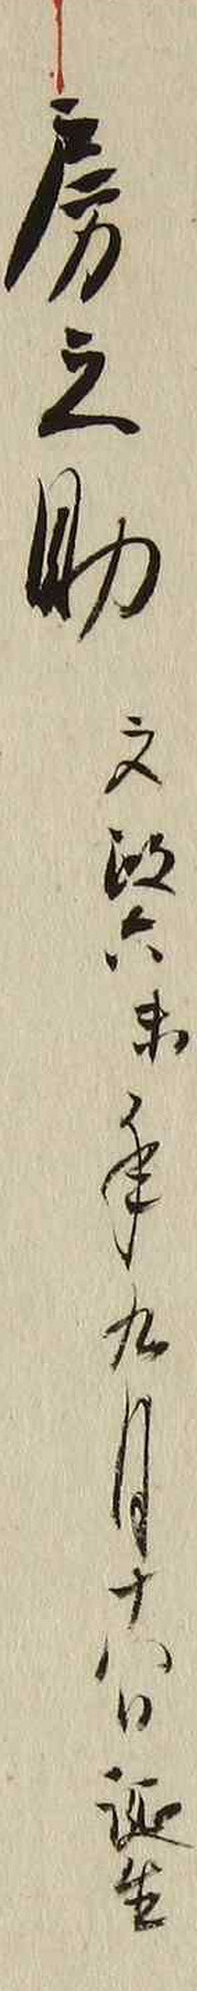房之助文政六未年九月十八日誕生
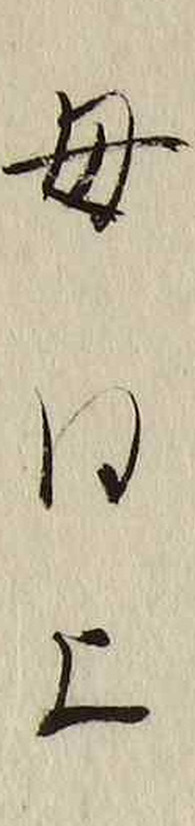母同上
